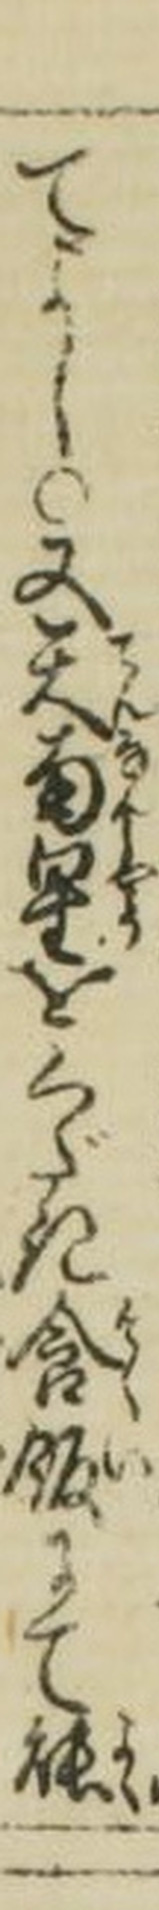てよし◯又天南星をくだき食飯にて能
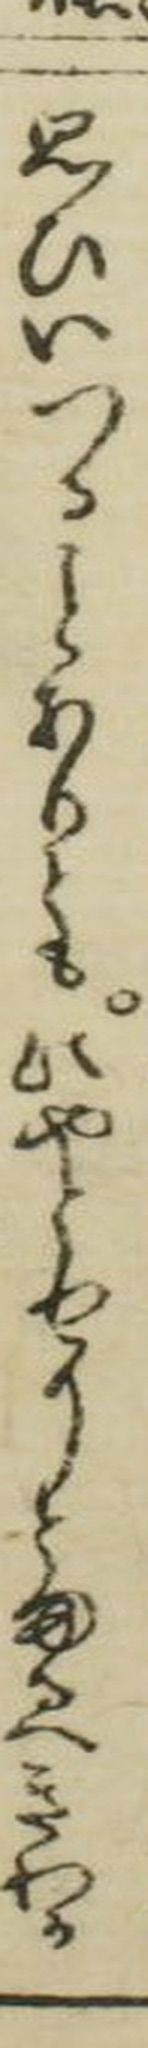思ひいつることありとも。此やとりにとまるへきわか
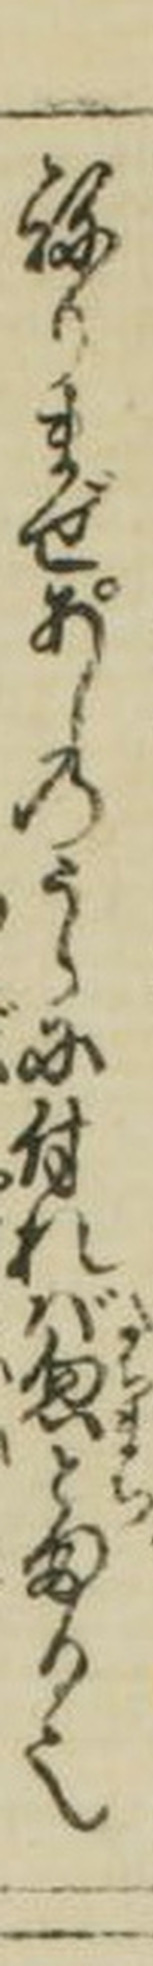ねりまぜ。あしのうらに付れば忽とまる也
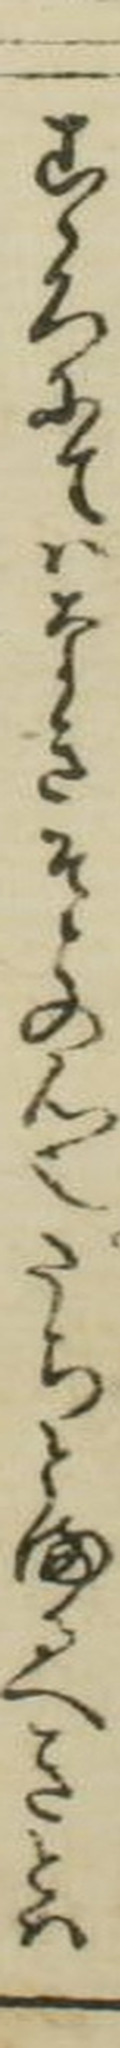こゝろにてはなきそとの心也。たちとまるへきとは
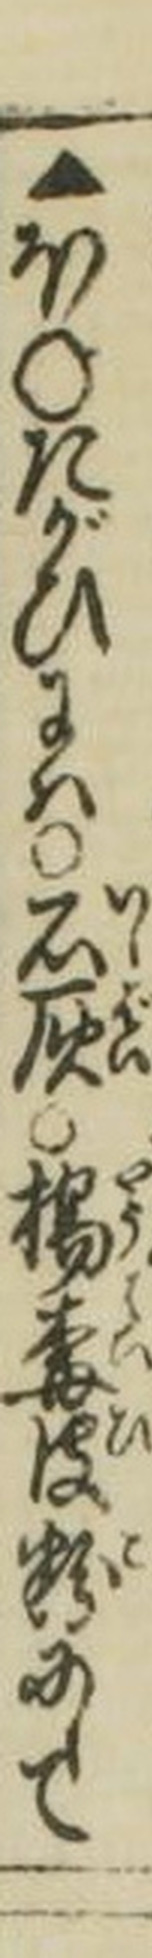▲ほねたがひには◯石灰◯楊梅皮粉にして
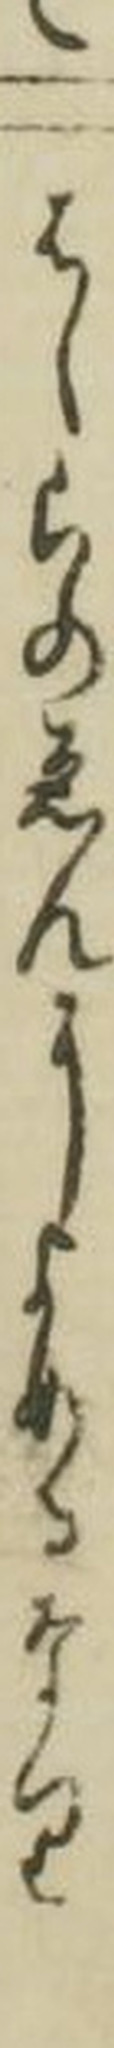はしらのゑんによめるなり
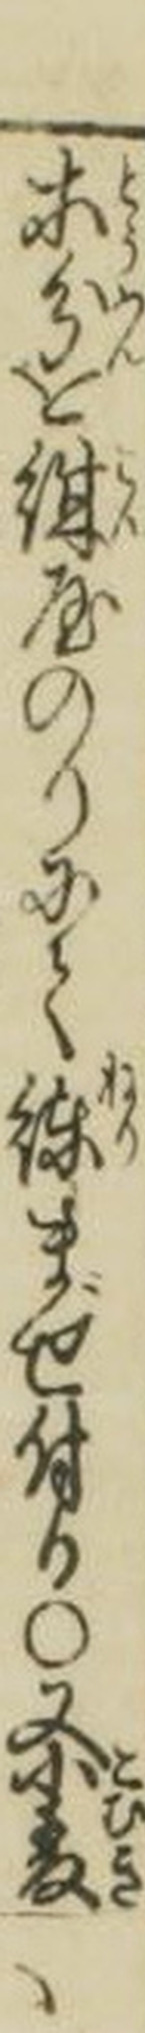等分を紺屋のりにて練まぜ付る◯又小麦
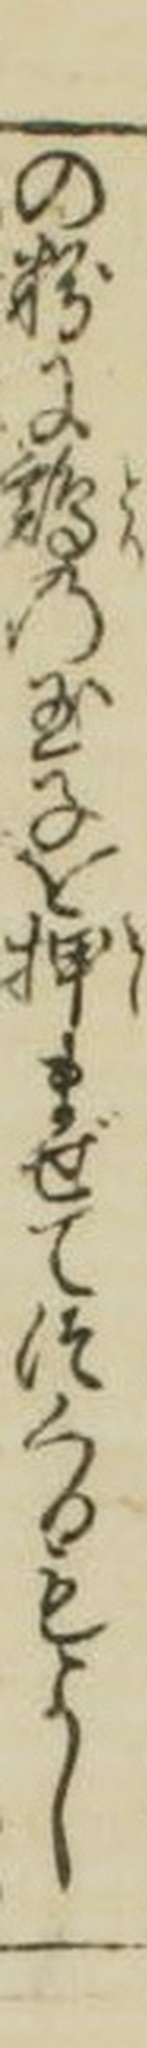の粉に鶏の玉子を押まぜてつくるもよし
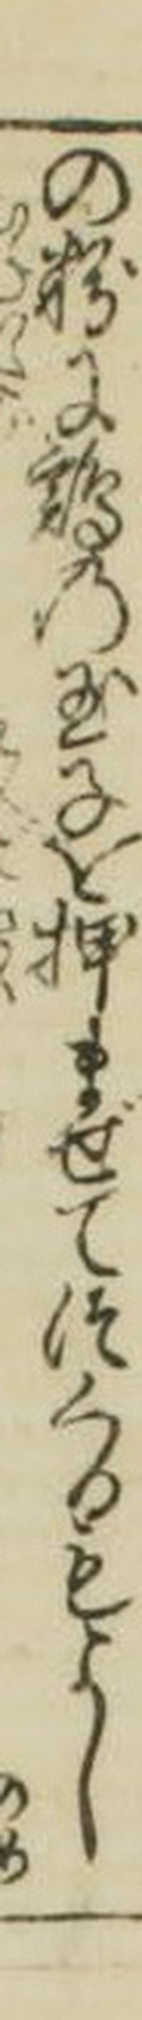の粉に鶏の玉子を押まぜてつくるもよし
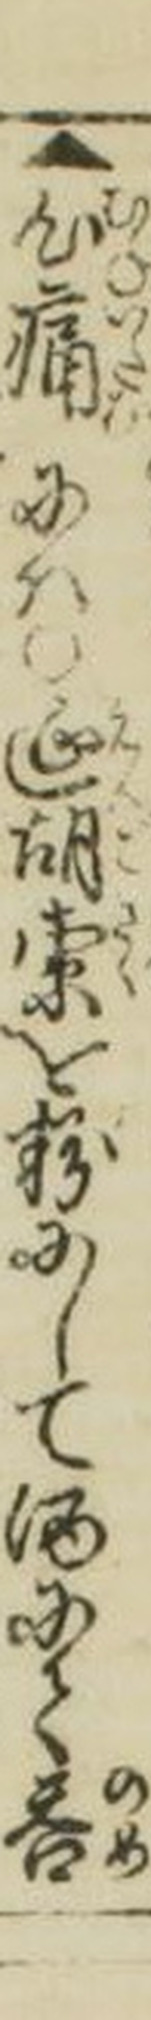▲心痛には◯延胡索を粉にして酒にて呑
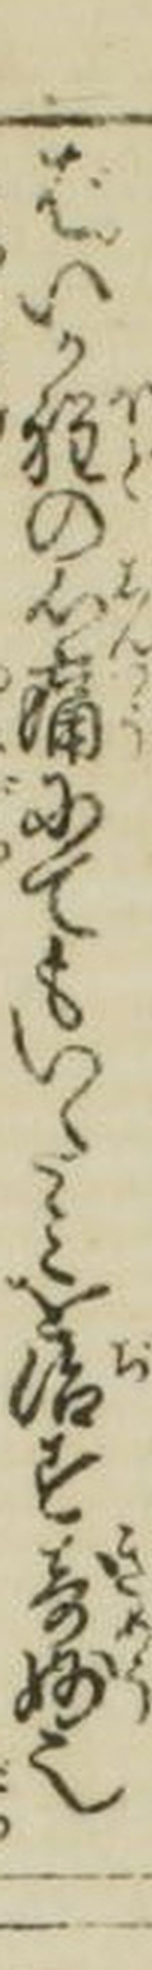ば。いか程の心痛にてもいたみを治す奇妙也
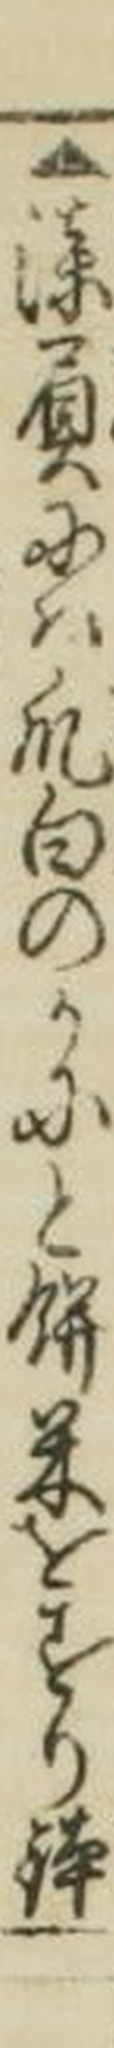▲漆負には爪白のかにと餅米をすり鉢
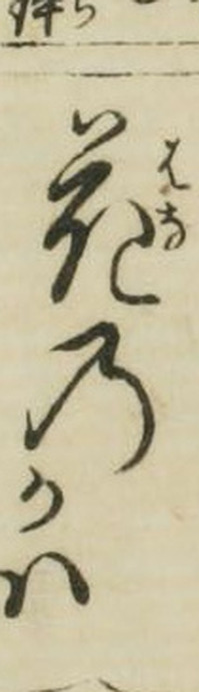花のかは
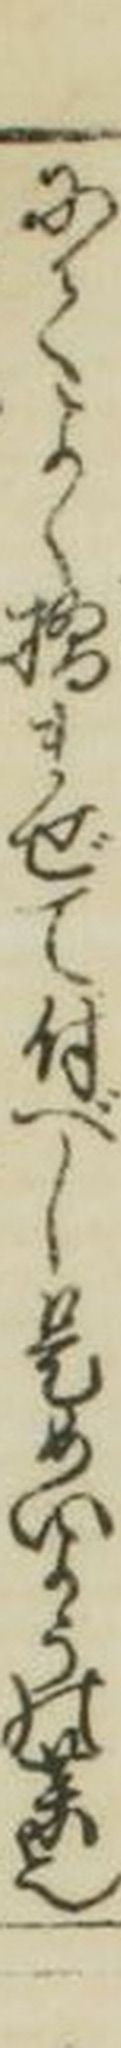にてよく摺まぜて付べし是めいようの薬也
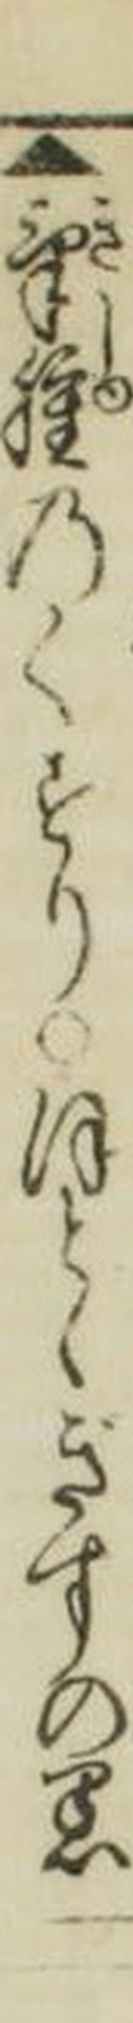▲気種のくすり◯ほとゝぎすの黒
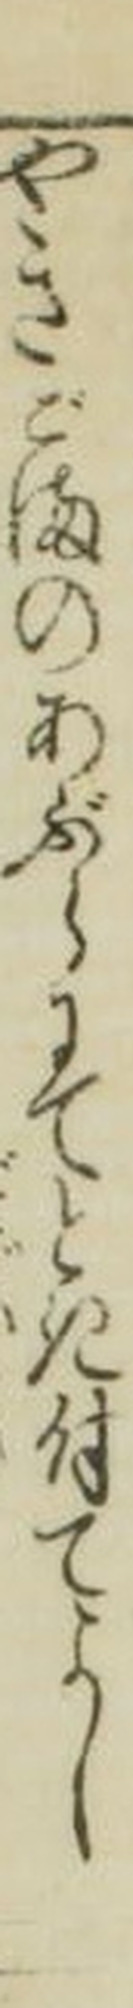やきごまのあぶらにてとき付てよし
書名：女源氏教訓鑑
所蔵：東京学芸大学附属図書館
